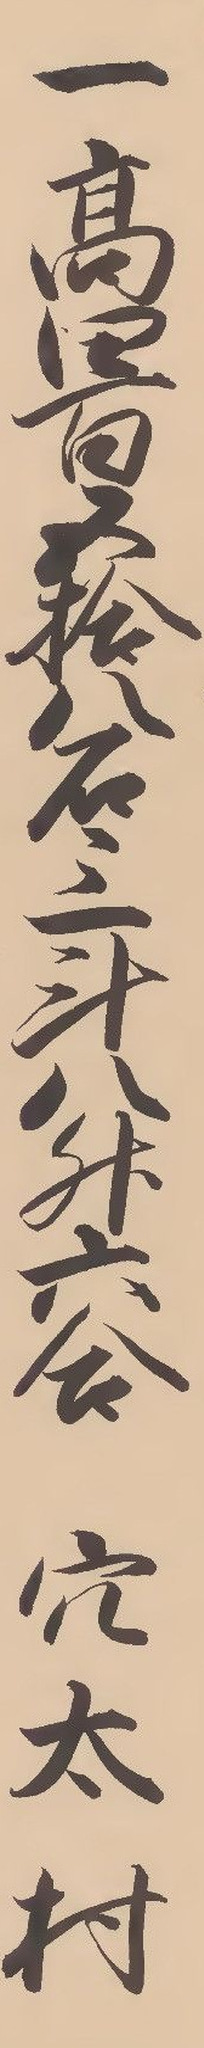一高四百五拾八石三斗八升六合穴太村
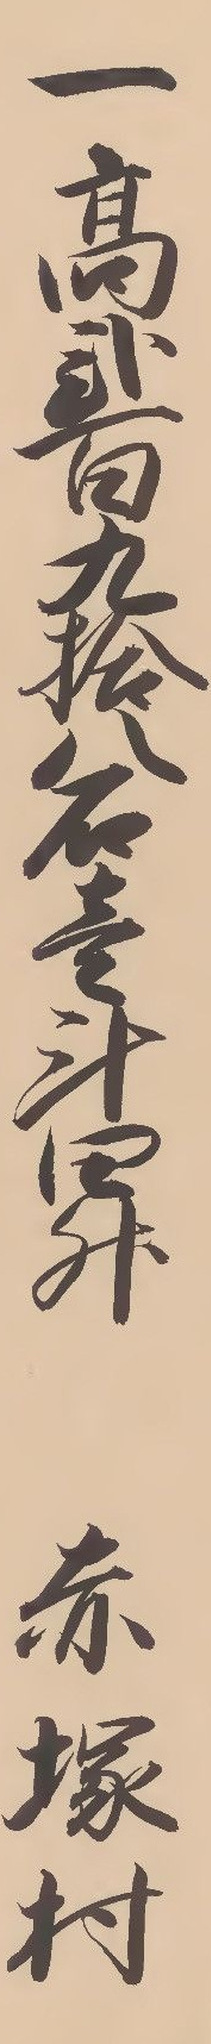一高弐百九拾八石壱斗四升赤塚村
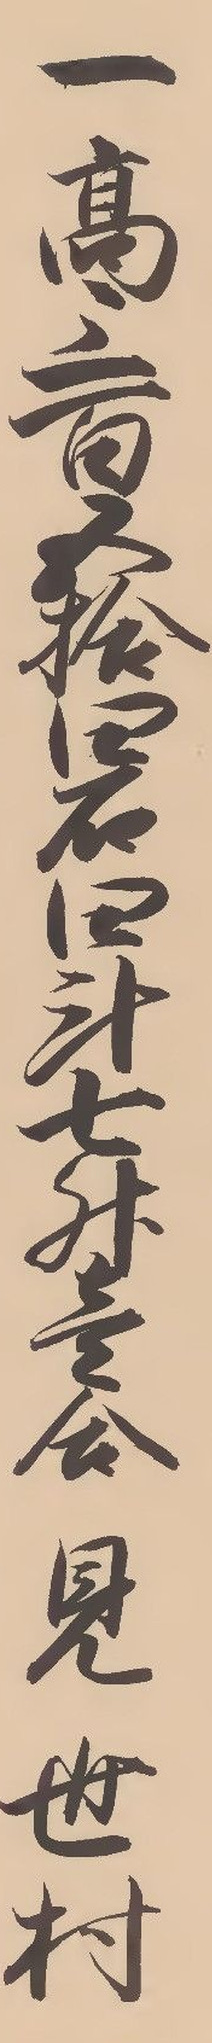一高三百五拾四石四斗七升壱合見世村
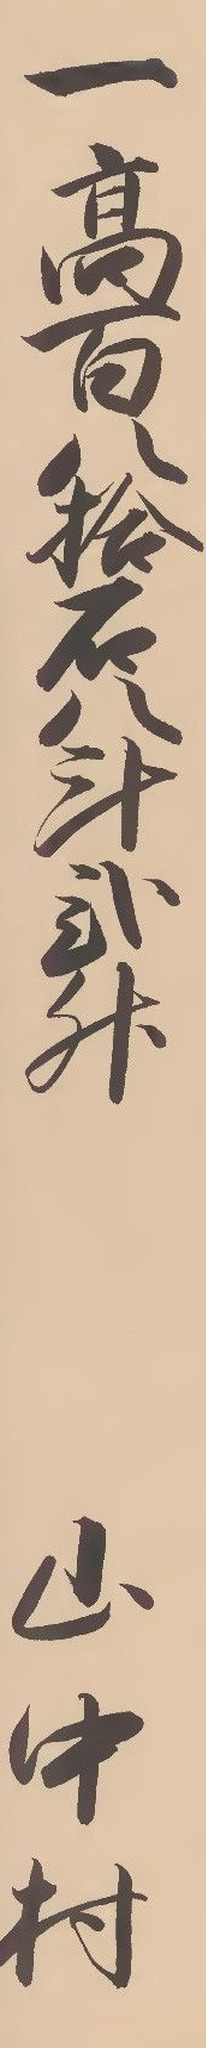一高百八拾石八斗弐升山中村
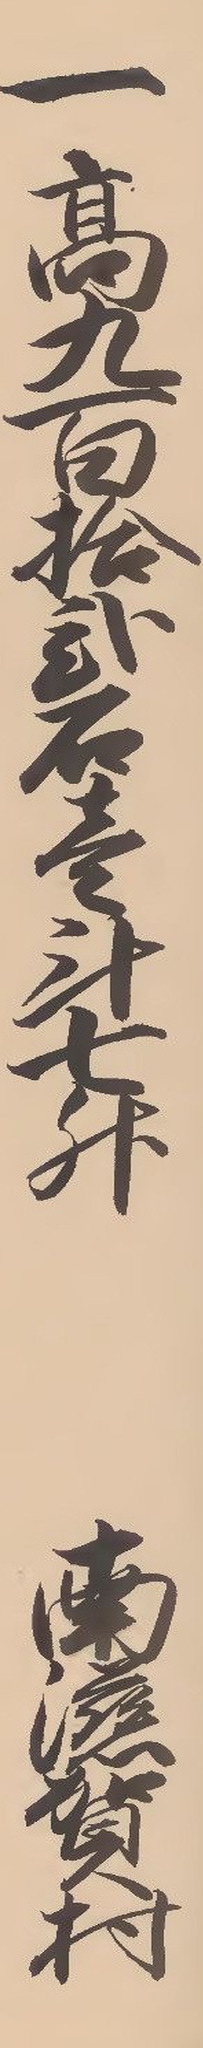一高九百拾弐石壱斗七升南滋賀村
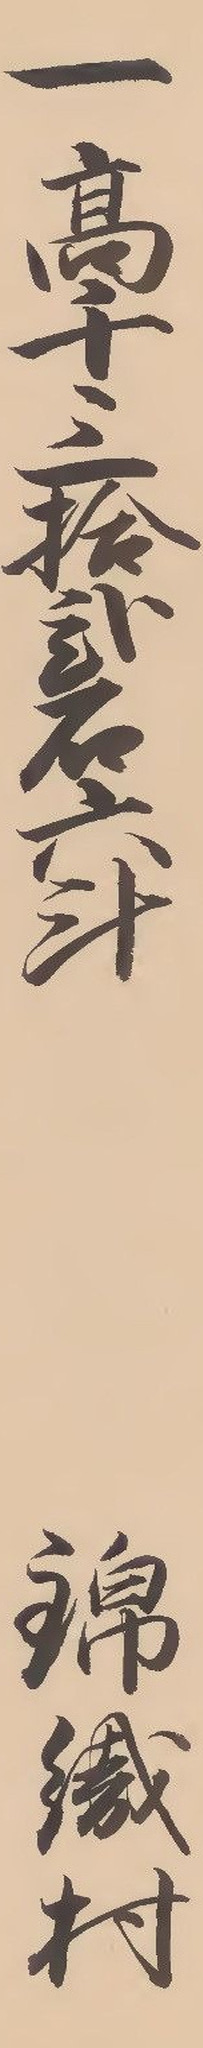一高千三拾弐石六斗錦織村
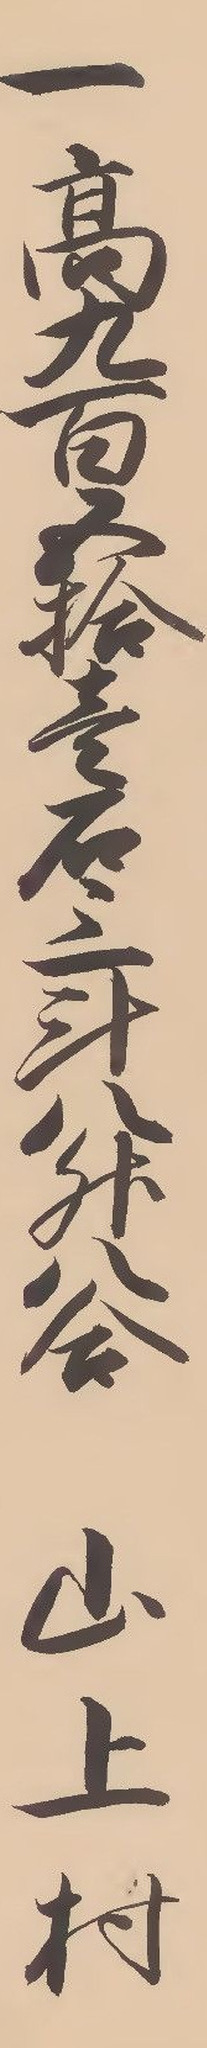一高九百五拾壱石三斗八升八合山上村
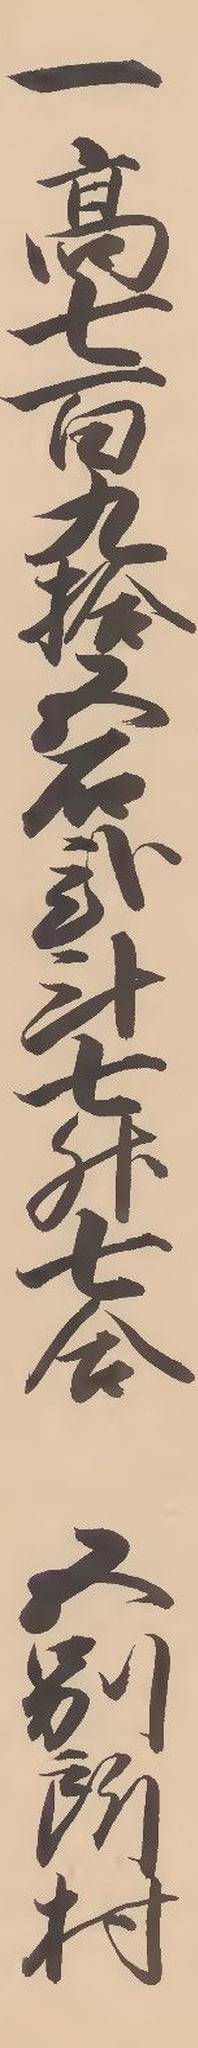一高七百九拾五石弐斗七升七合五別所村

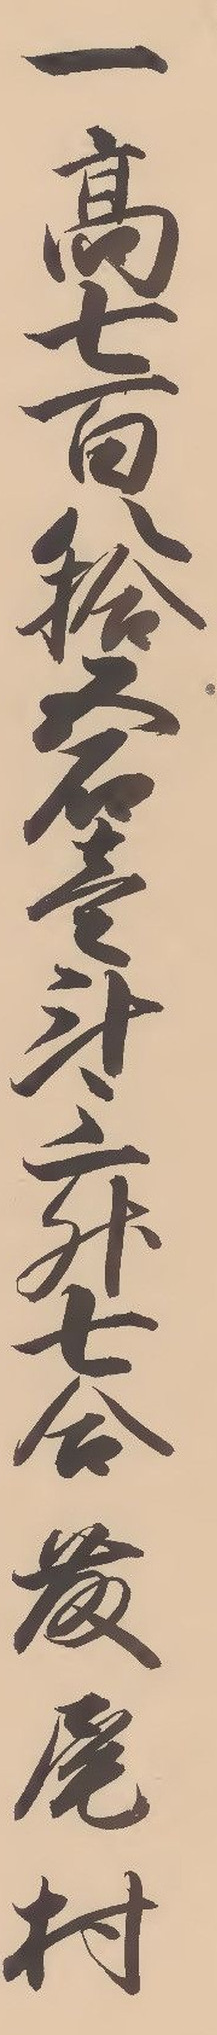一高七百八拾五石壱斗三升七合藤尾村
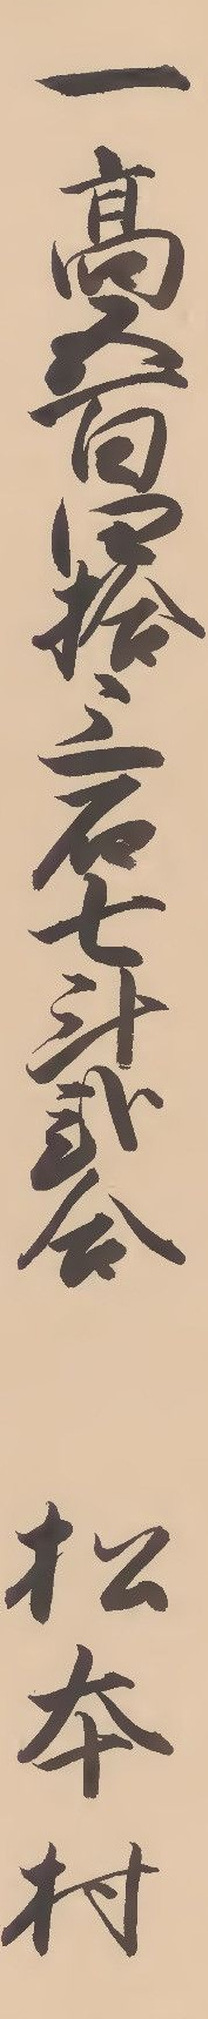一高五百四拾三石七斗弐合松本村
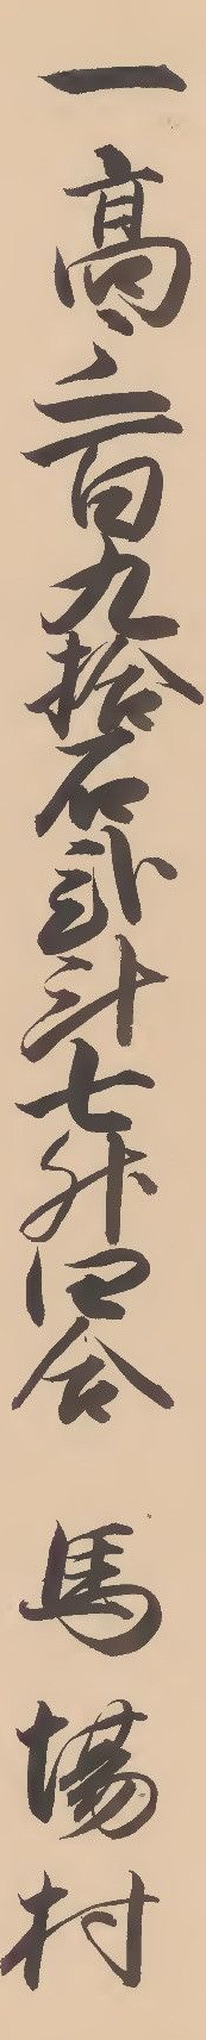一高三百九拾石弐斗七升四合馬場村
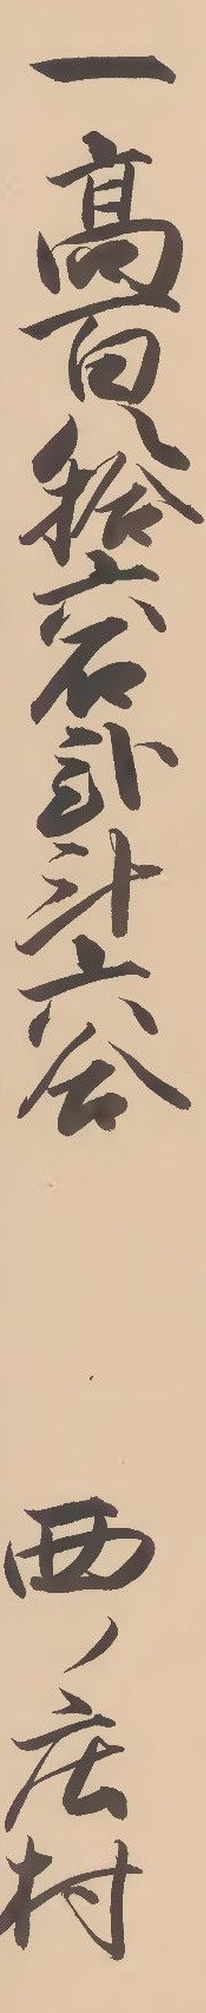一高百八拾六石弐斗六合西ノ庄村
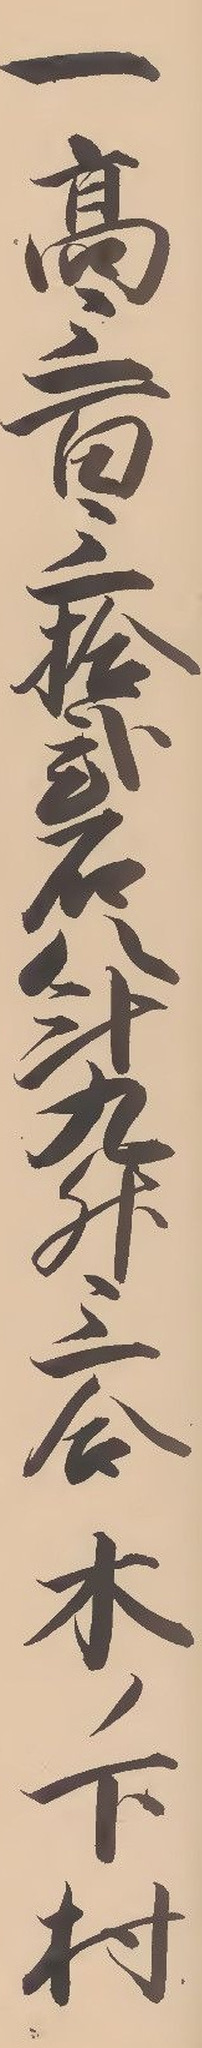一高三百三拾弐石八斗九升三合木ノ下村
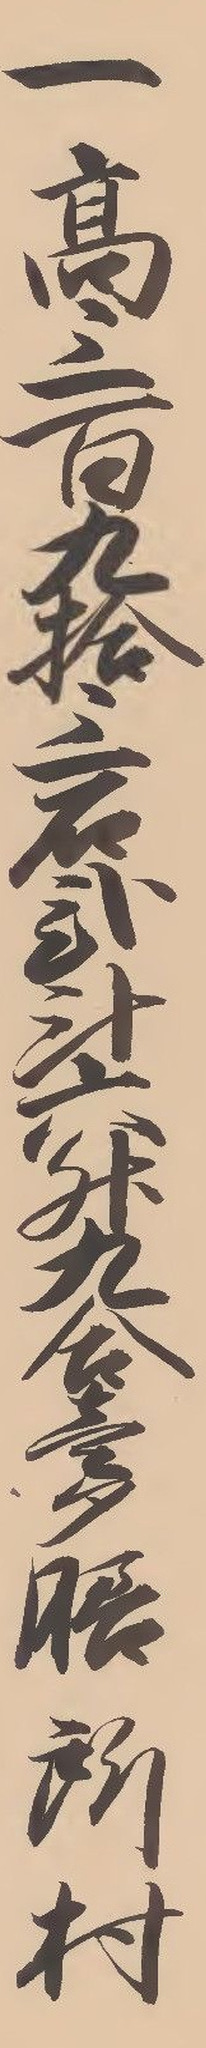一高三百九拾三石弐斗六升九合壱勺膳所村
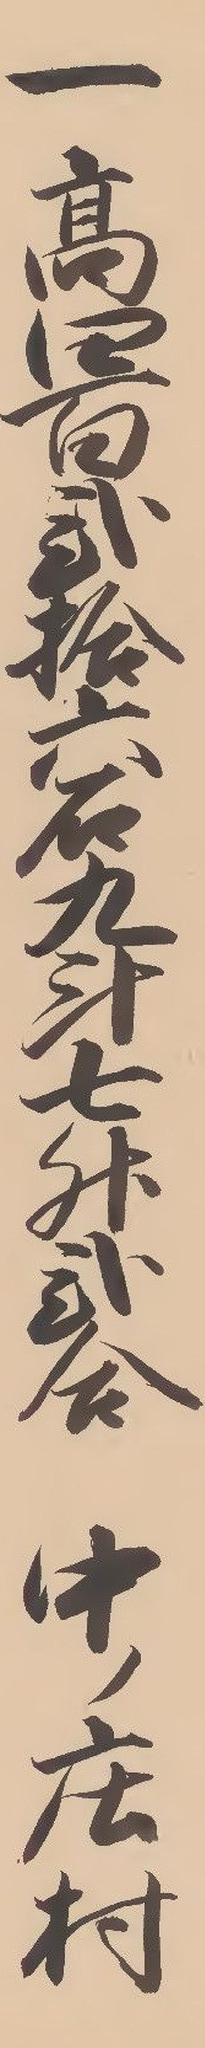一高四百弐拾六石九斗七升弐合中ノ庄村
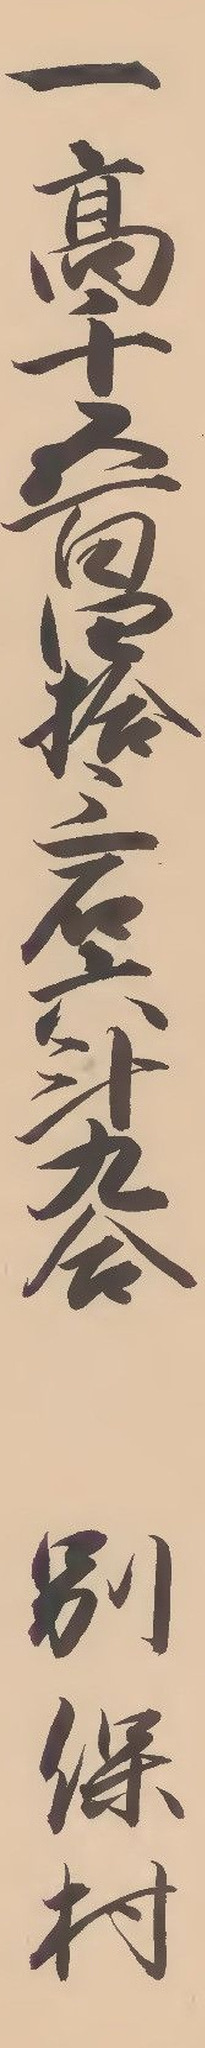一高千五百四拾三石六斗九合別保村
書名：近江国郷帳
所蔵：国立公文書館 National Archives of Japan
